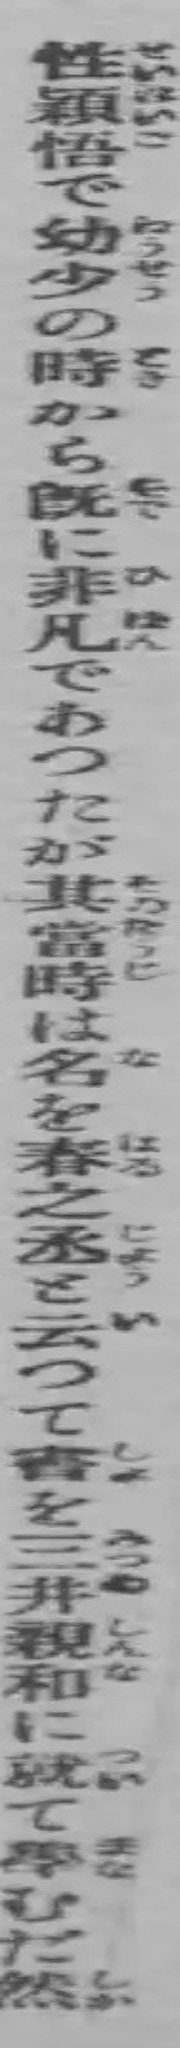性穎悟で幼少の時から既に非凡であつたが其当時は名を春之丞と云つて書を三井親和に就て学むだ然
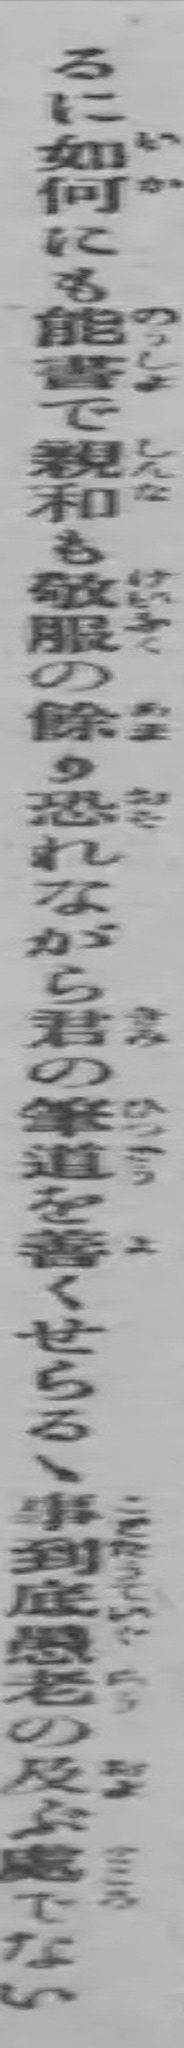るに如何にも能書で親和も敬服の余り恐れながら君の筆道を善くせらるゝ事到底愚老の及ぶ処でない
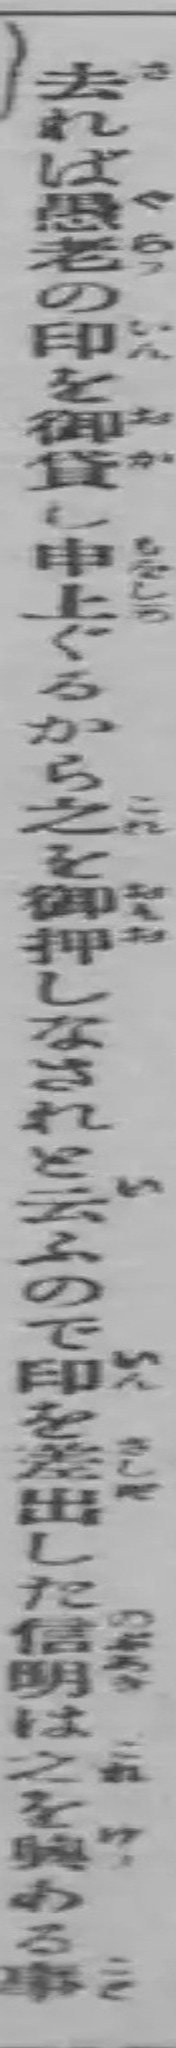去れば愚老の印を御貸し申上ぐるから之を御押しなされと云ふので印を差出した信明は之を興ある事
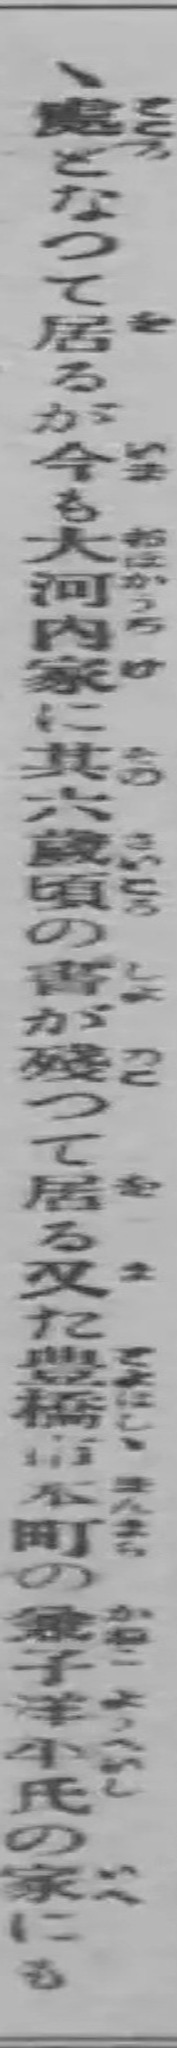ゝ処となつて居るが今も大河内家に其六歳頃の書が残つて居る又た豊橋市本町の兼子洋平氏の家にも
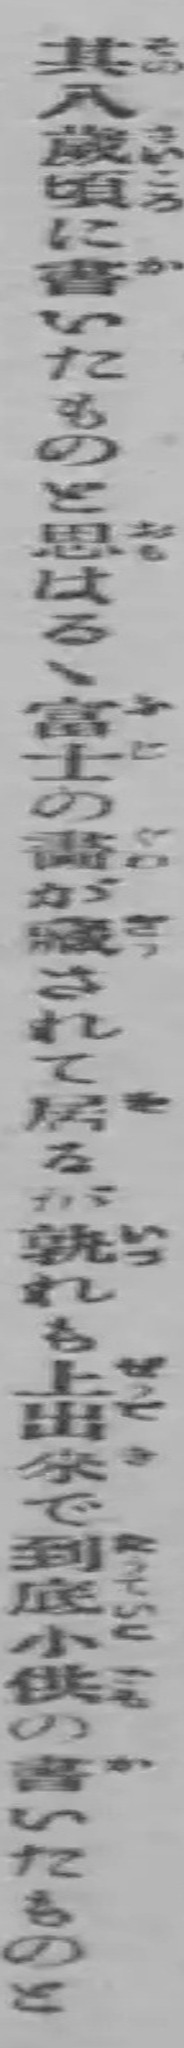其八歳頃に書いたものと思はるゝ富士の画が蔵されて居るが孰れも上出来で到底小供の書いたものと
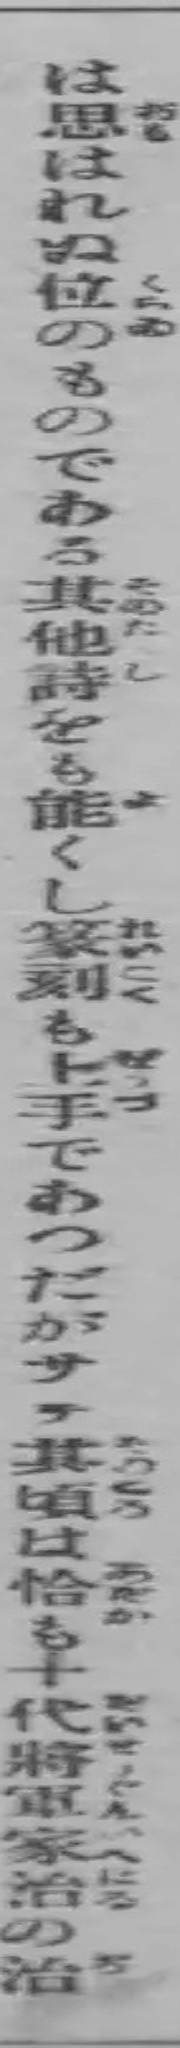は思はれぬ位のものである其他詩をも能くし篆刻も上手であつたがサテ其頃は恰も十代将軍家治の治
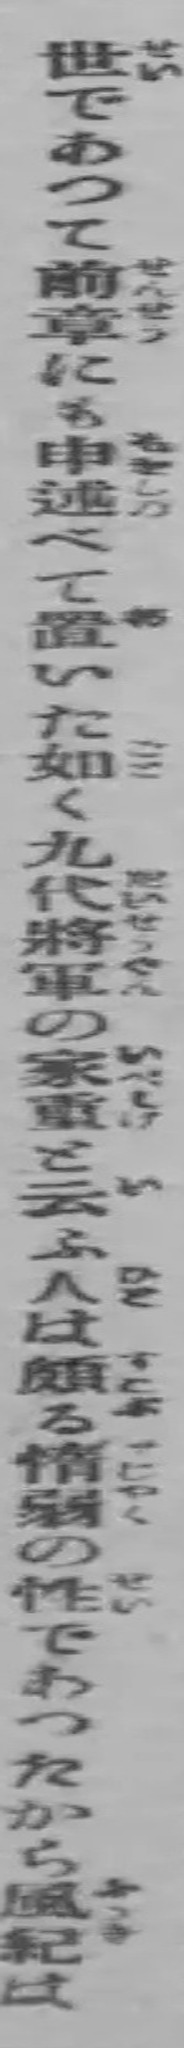世であつて前章にも申述べて置いた如く九代将軍の家重と云ふ人は頗る惰弱の性であつたから風紀は

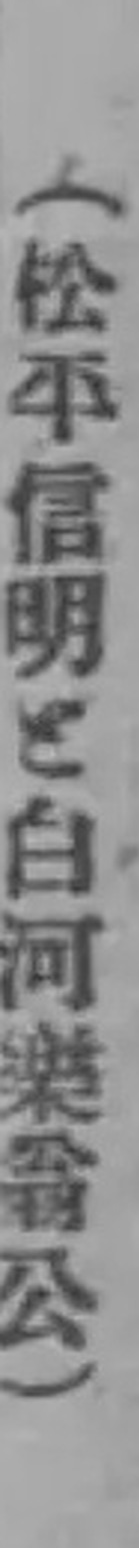⦿松平信明と白河楽翁公
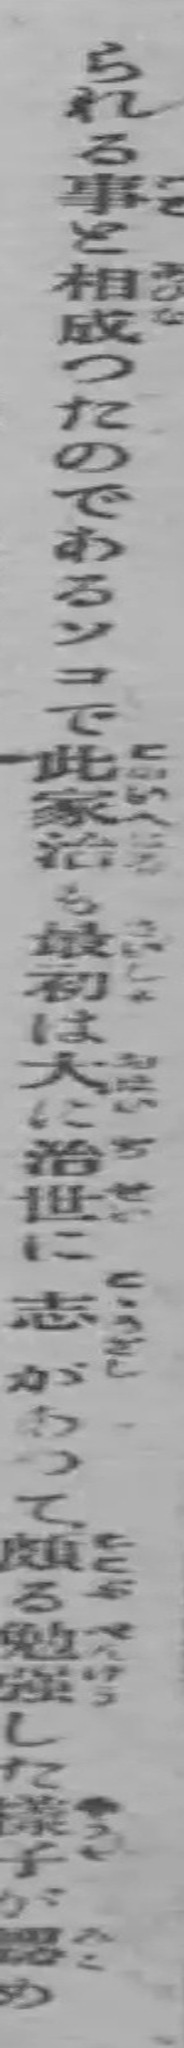られる事と相成つたのであるソコで此家治も最初は大に治世に志があつて頗る勉強した様子が認め
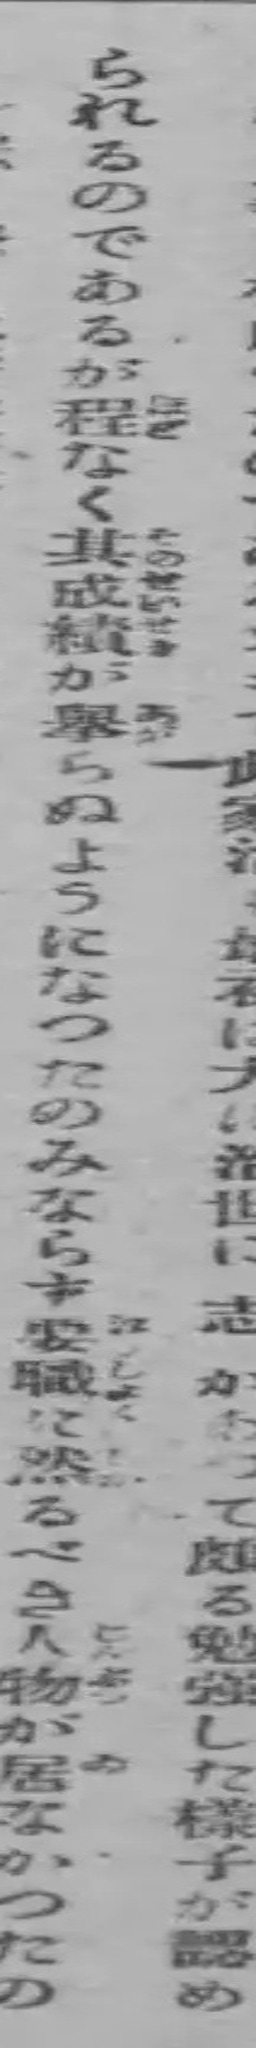られるのであるが程なく其成績が挙らぬようになつたのみならず要職に然るべき人物が居なかつたの
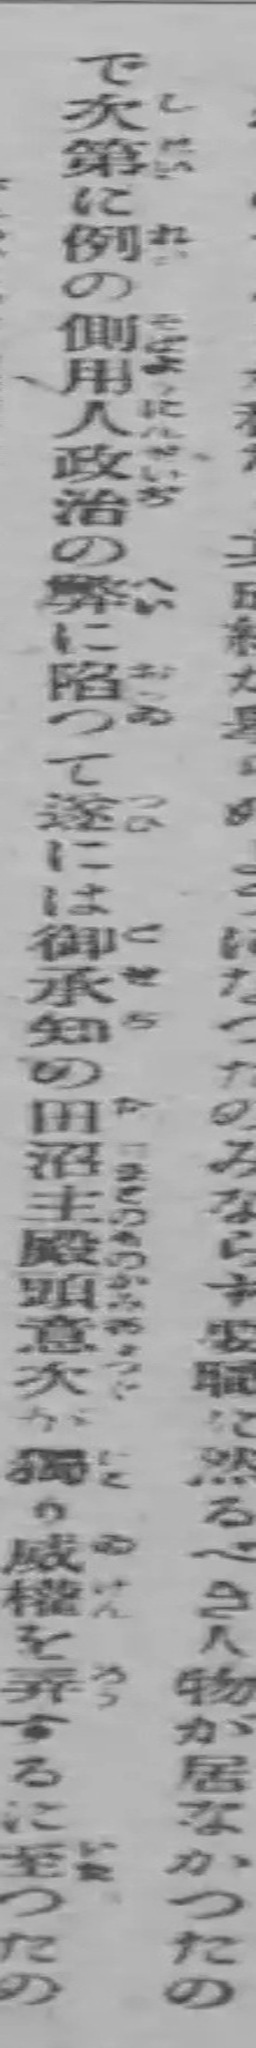田沼意次で次第に例の側用人政治の弊に陥つて遂に御承知の田沼主殿頭意次が独り威権を弄するに至つたの
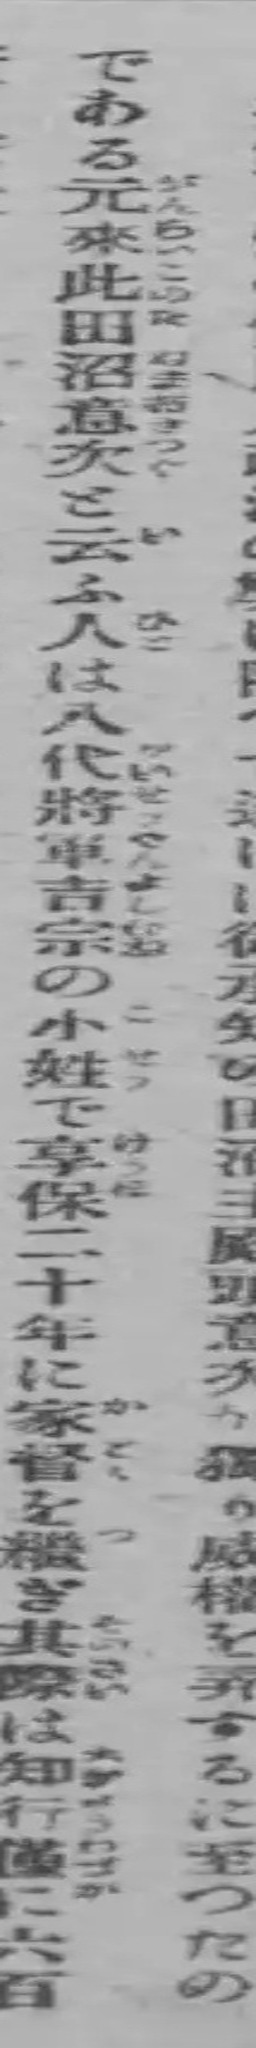である元来此田沼意次と云ふ人は八代将軍吉宗の小姓で享保二十年に家督を継ぎ其際は知行僅に六百
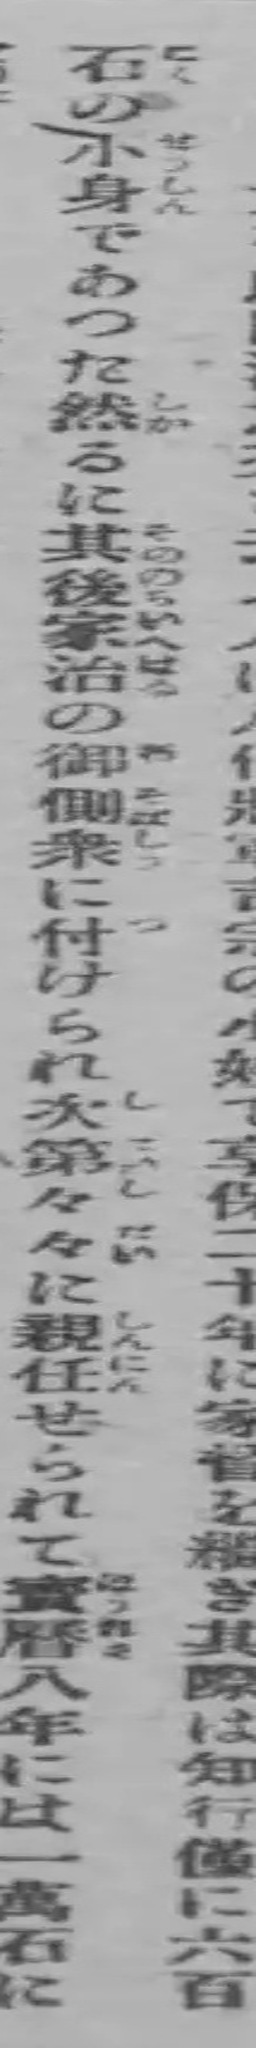石の小身であつた然るに其後家治の御側衆に付けられ次第々々に親任せられて宝暦八年には一万石に
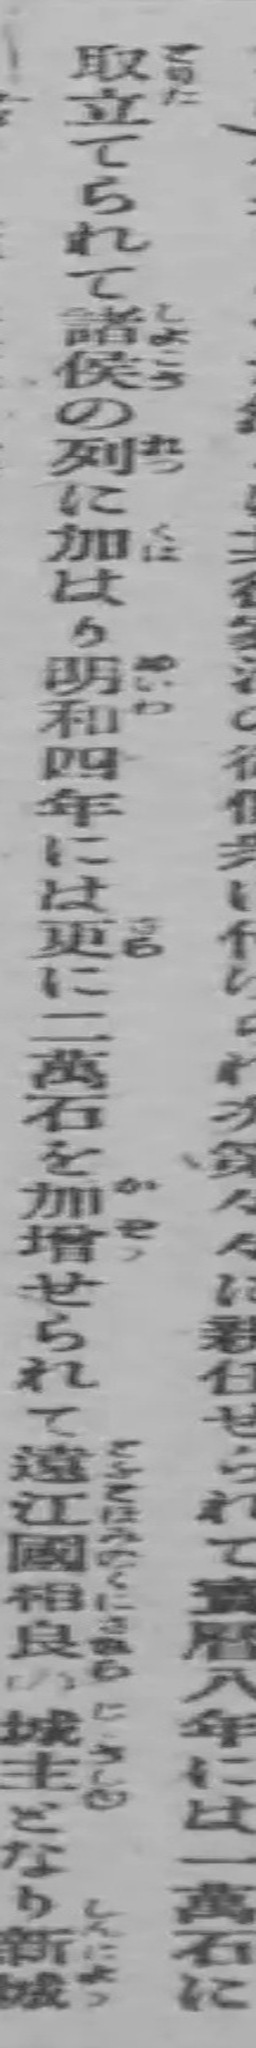取立てられて諸侯の列に加はり明和四年には更に二万石を加増せられて遠江国相良の城主となり新城
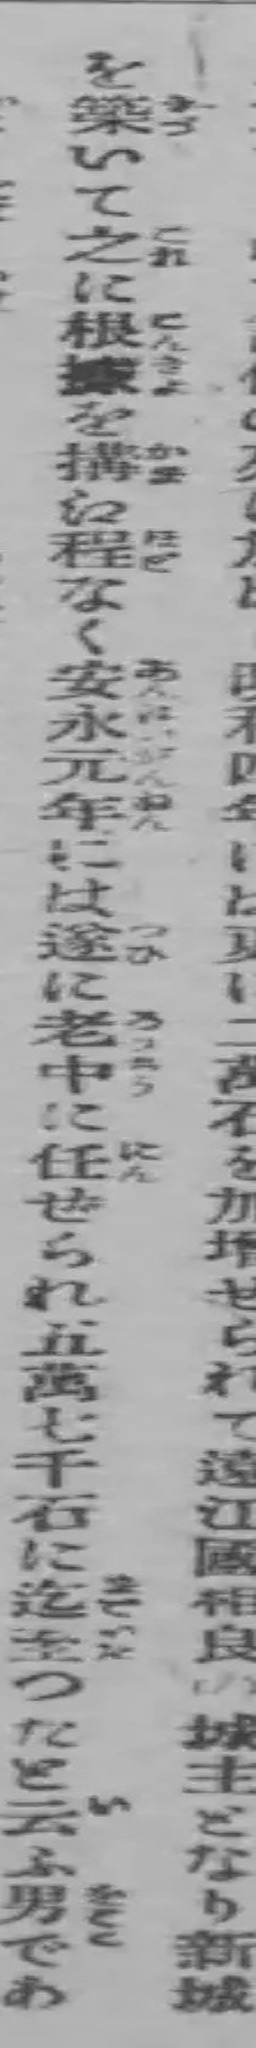を築いて之に根拠を構え程なく安永元年には遂に老中に任ぜられ五万七千石に迄至つたと云ふ男であ
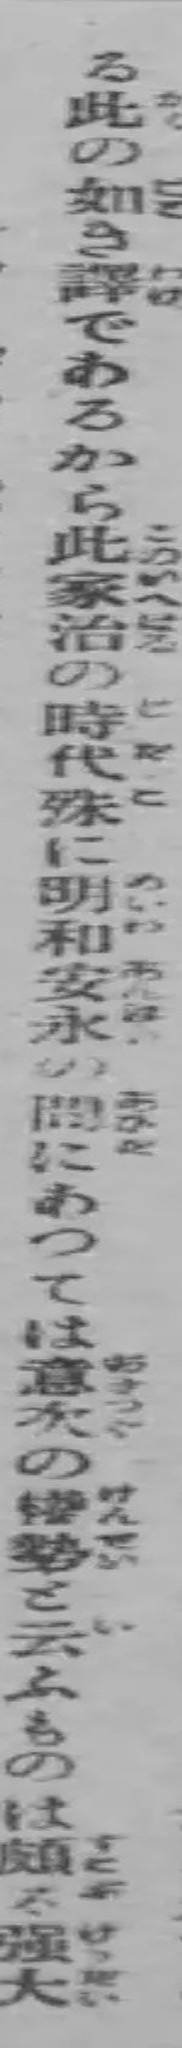る此の如きわ訳であるから此家治の時代殊に明和安永の間にあつては意次の権勢と云ふもの頗る強大
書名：豊橋市史談
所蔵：国立国会図書館 National Diet Library, JAPAN
